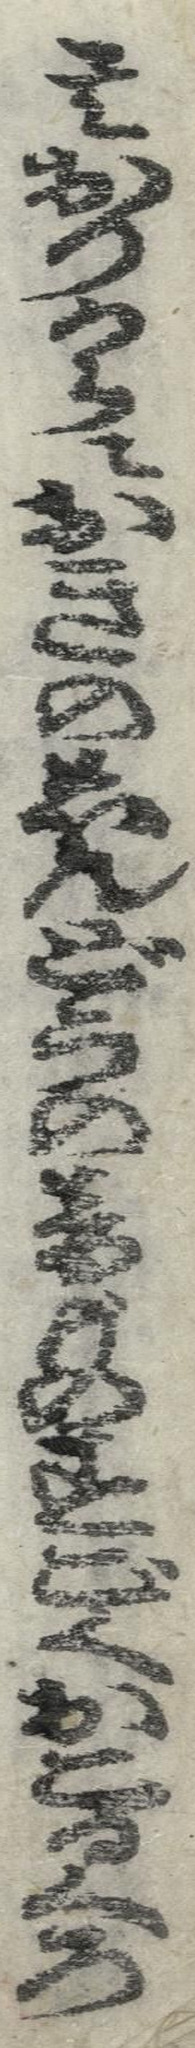其おりからにいきのしんどうの音ものすごくおこるくろ
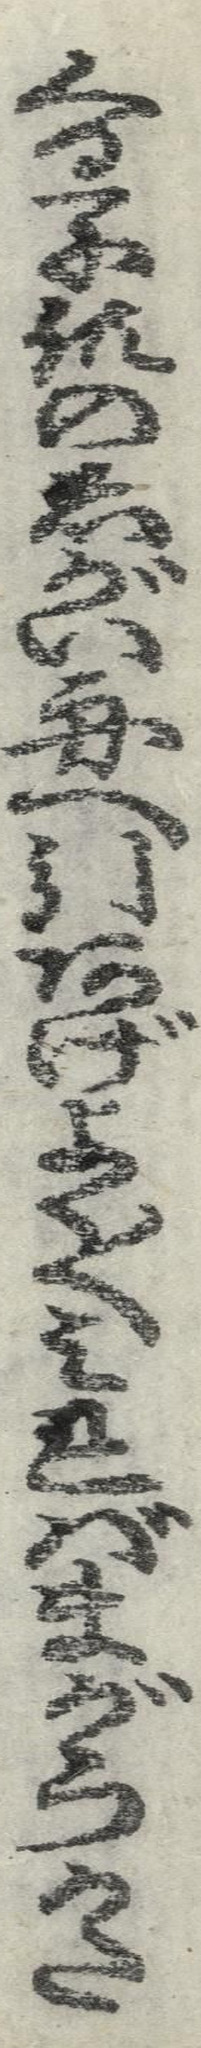くも只ごとならず舟へ引あげよく〳〵みればまがうかた
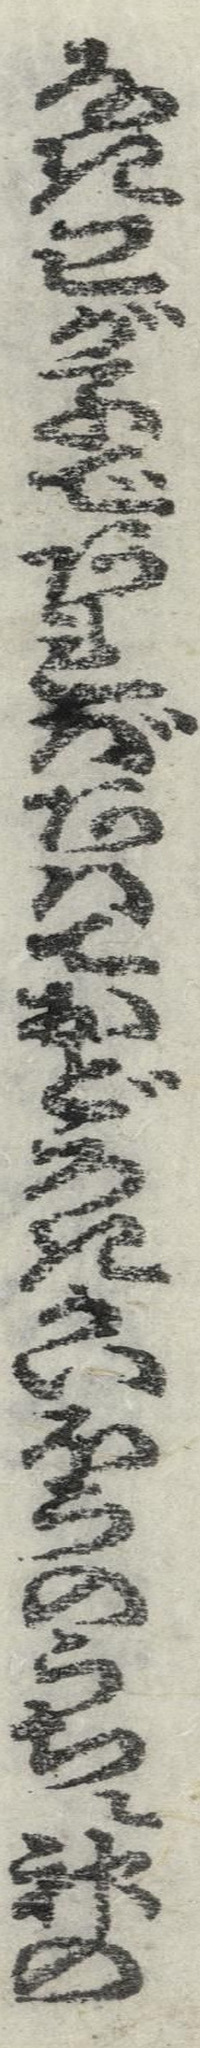なきわが子であればあはておどろきかいほうのうちに神の
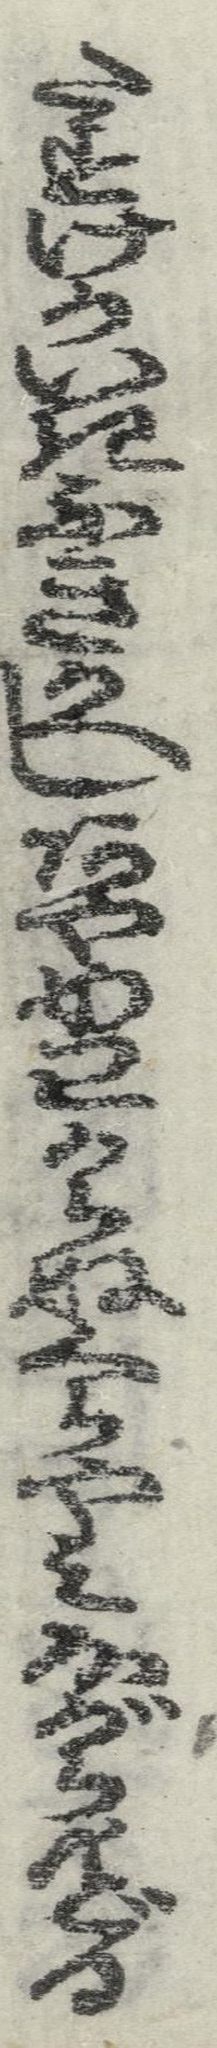たすけかいきづきかへしあやめわからぬくらうあみながらもどる
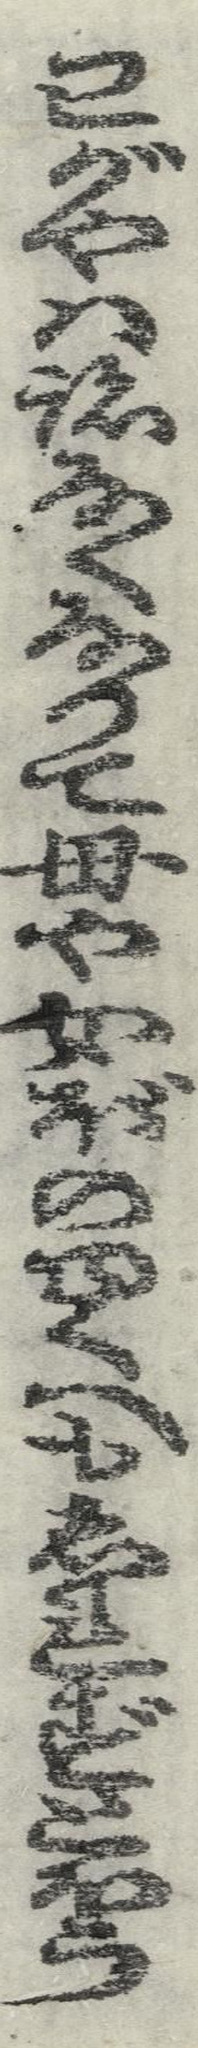わがやは諸なくなりて母や女ぼのゆくへもしれずとほう
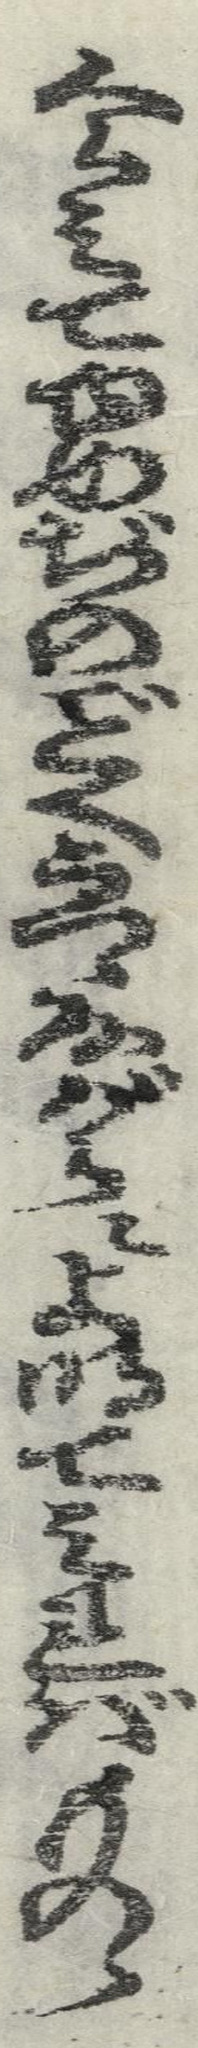くらみてゆめぢのごとくうつゝながらによ明てみればものゝ
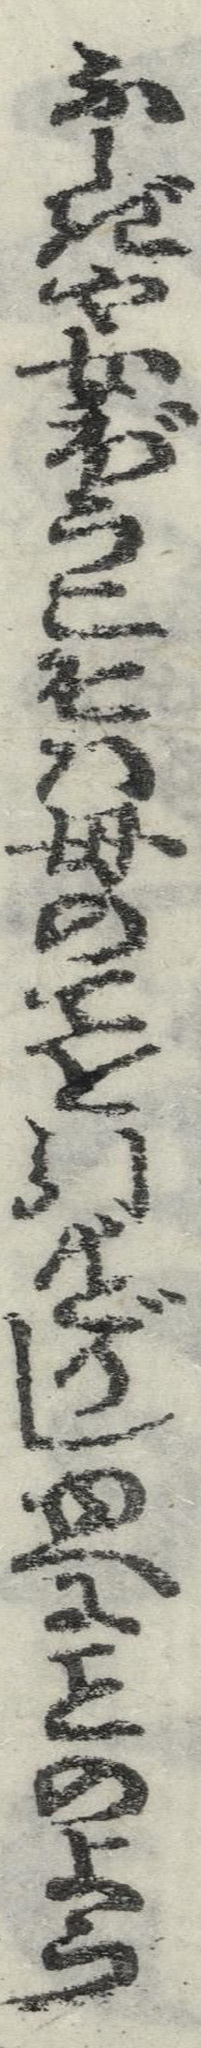ふしぎや女ぼうこそは母のてを引もどりしゆへにことのよら
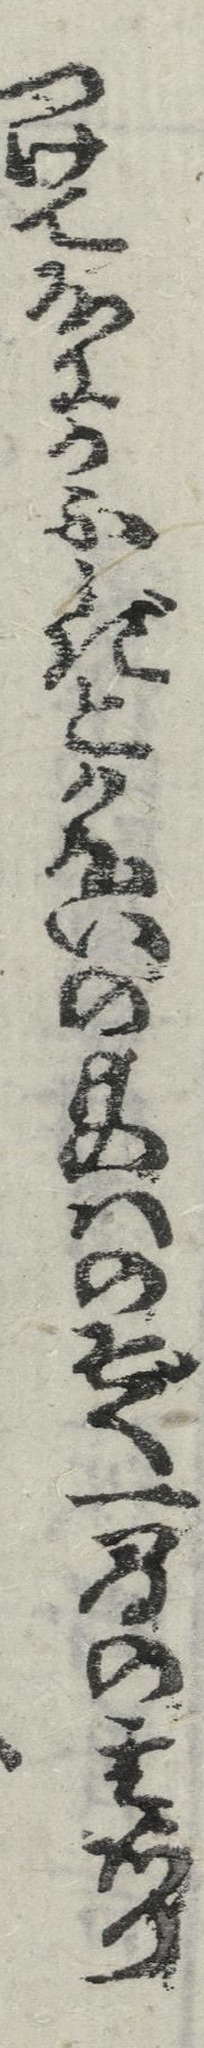つけてなにかふしぎとかないのものはのぞく一間の其あり
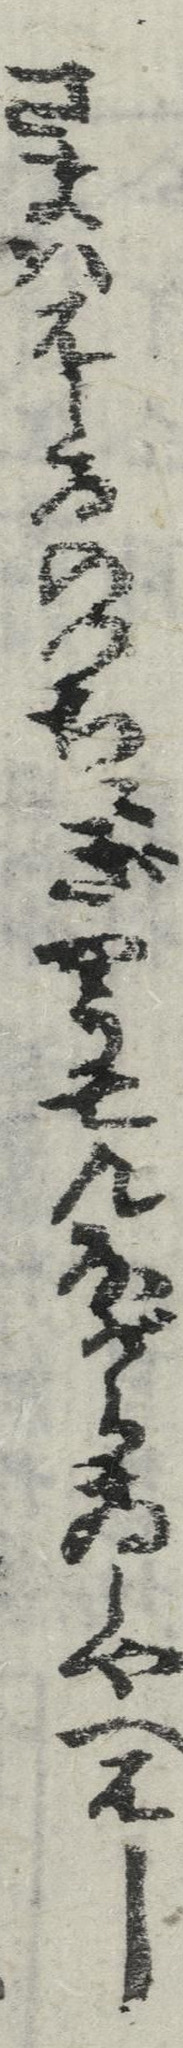さまははしるのりちにぎりそんほがらぬしやへはし
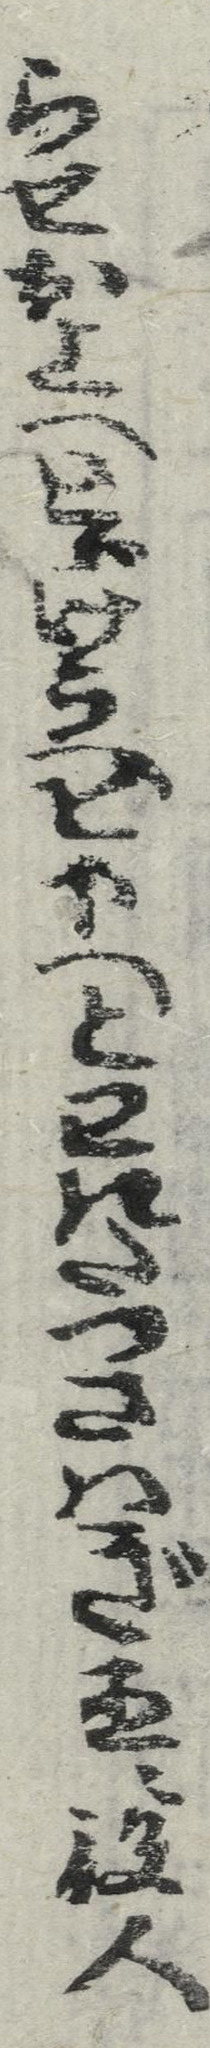らせお上へわらけうへを下へとわけたつさはぎ直に役人
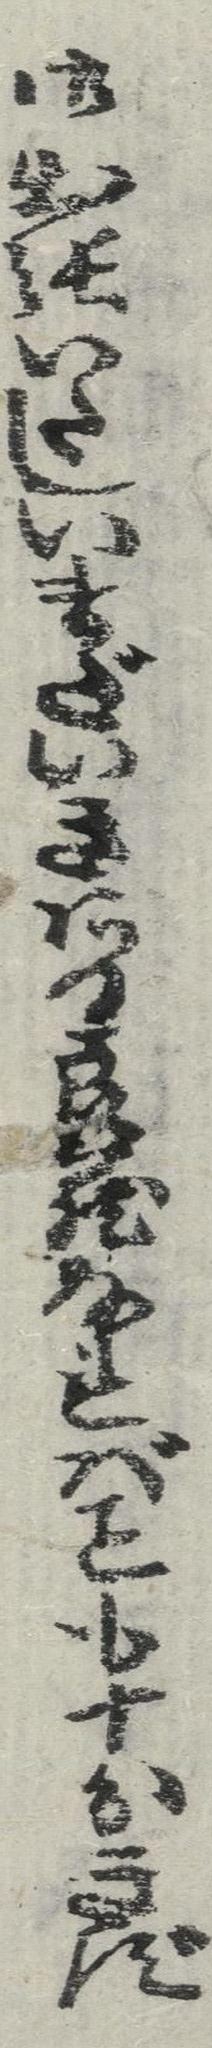御出張いたしいまだいきある良蔵なればことも十分きず
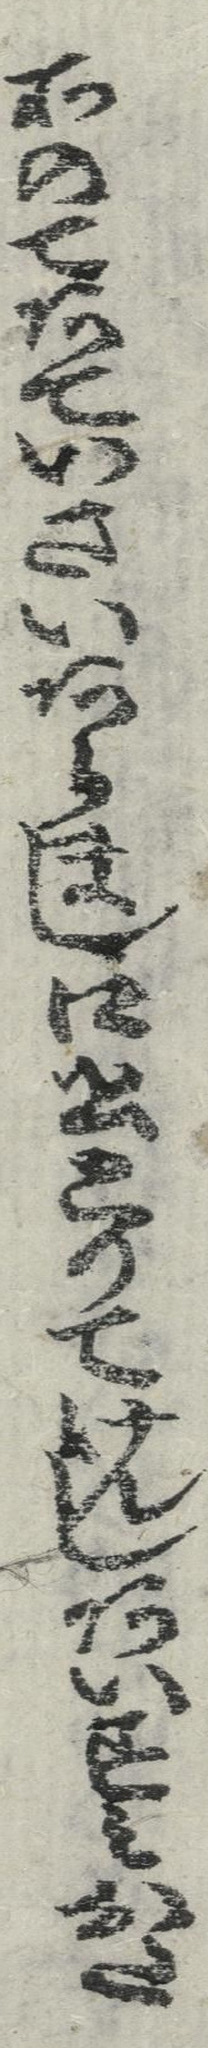所のてあていさいあらまし口書とりてけんしあいすみおた
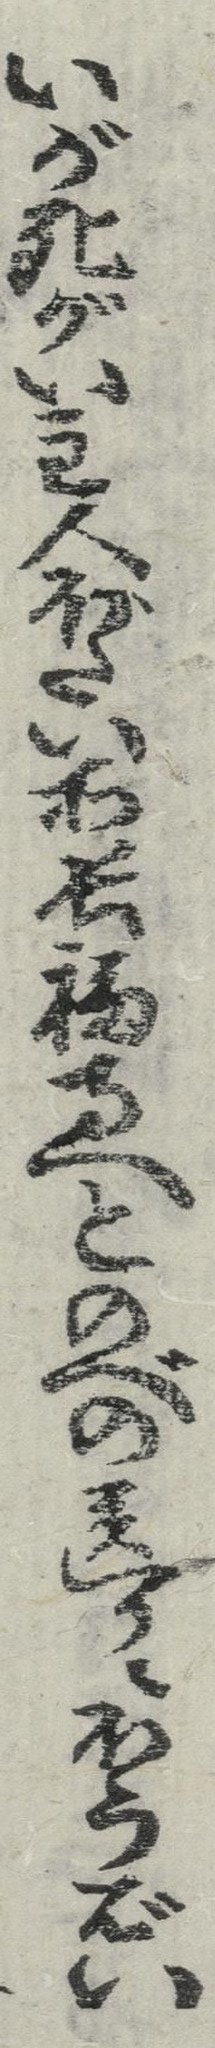いが死がい主人ぼたいところ長福寺へとのべの送りにほうばい
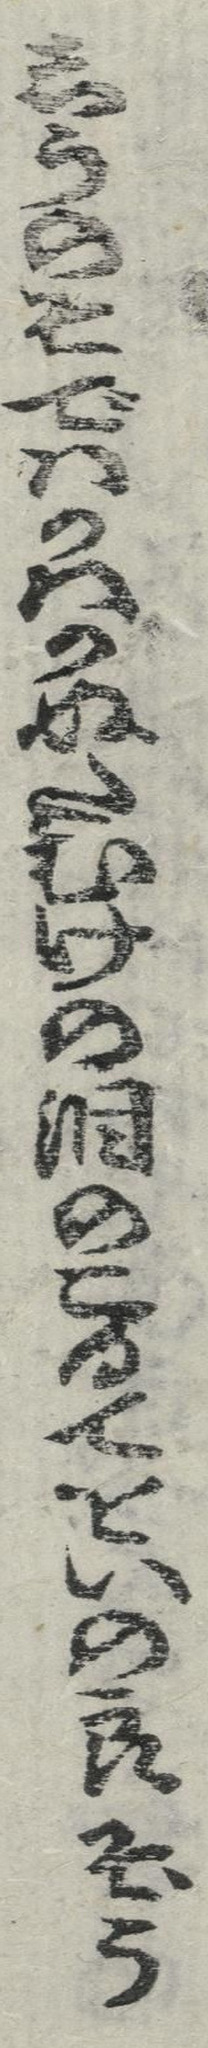しうのそではかはかぬたむけの泪のこるてをいの良ぞう
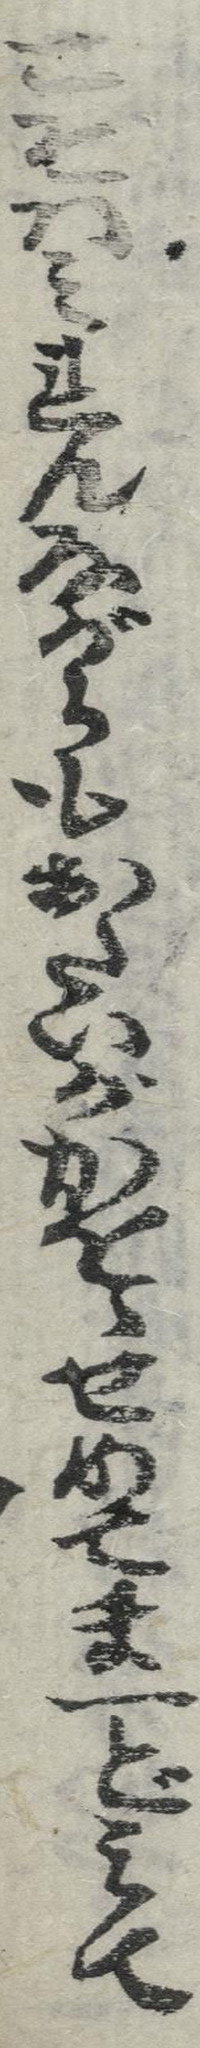こそはみれんながらもおたいがかをゝせめてま一どみて

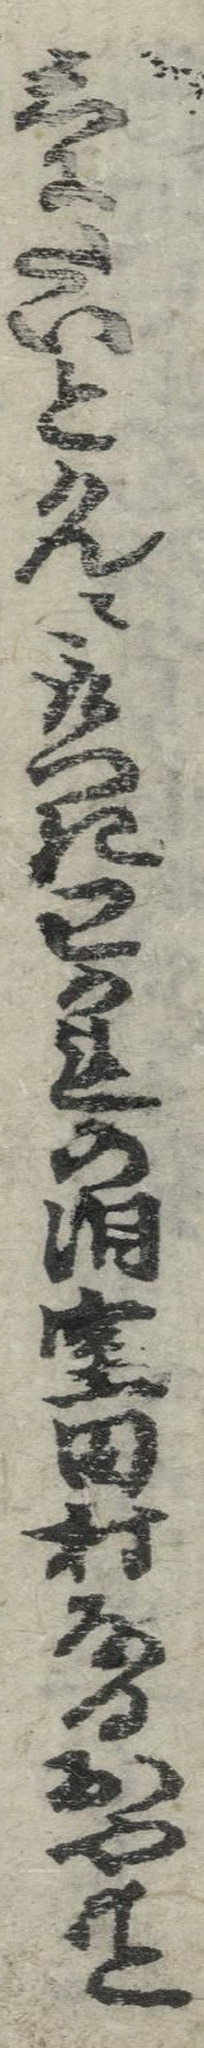しにたいとかんに取つきわかれの泪室田村なるおやもと
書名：奥州すじ大つなみおおあれくどき
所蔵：東京大学地震研究所図書室 Earthquake Research Institute Library, The University of Tokyo, JAPAN
